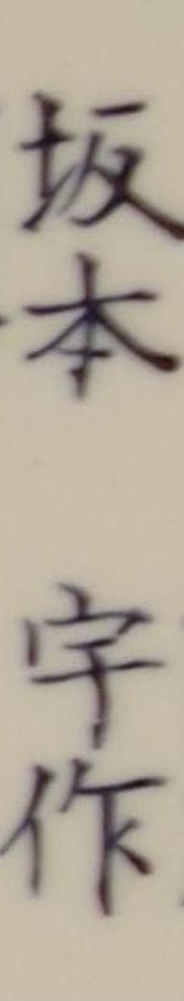坂本宇作
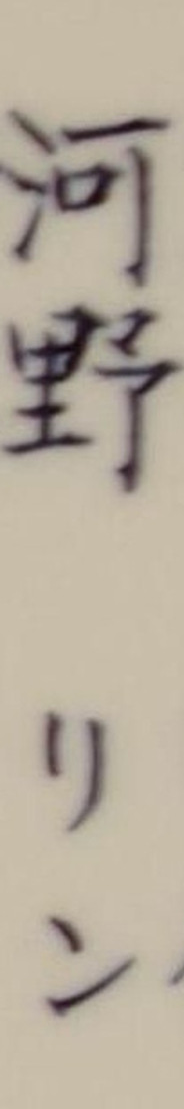河野リン
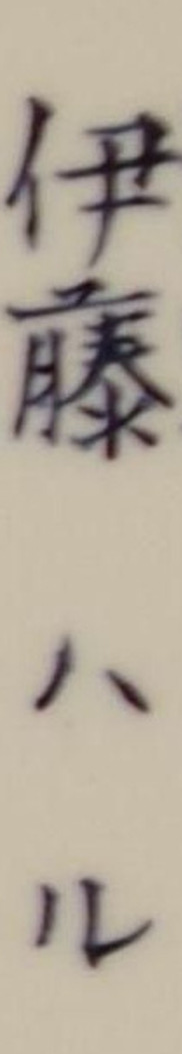伊藤ハル
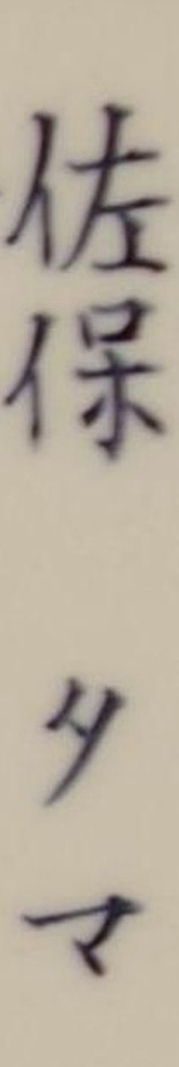佐保タマ
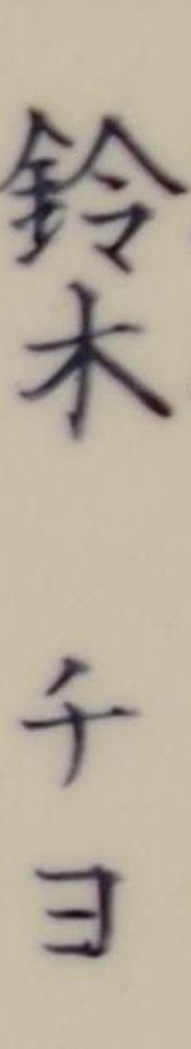鈴木チヨ
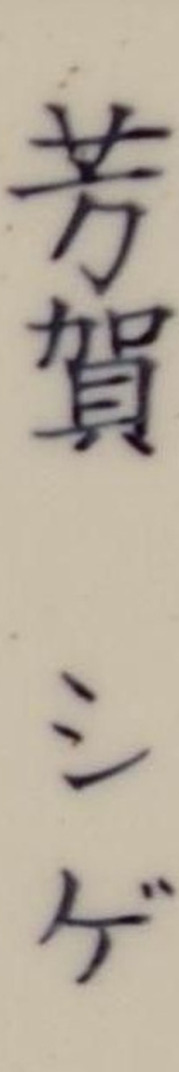芳賀シゲ
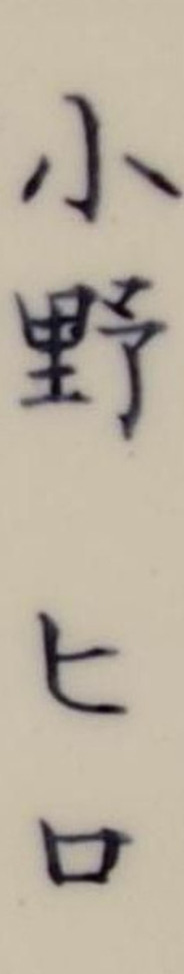小野ヒロ
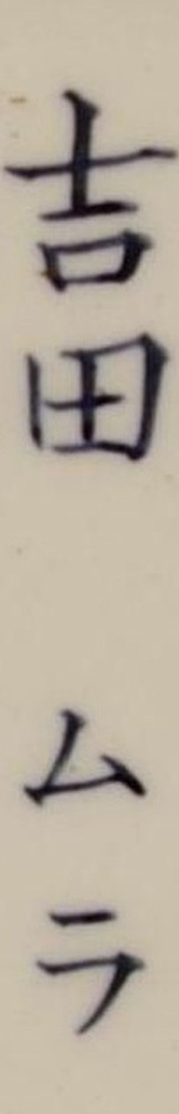吉田ムラ
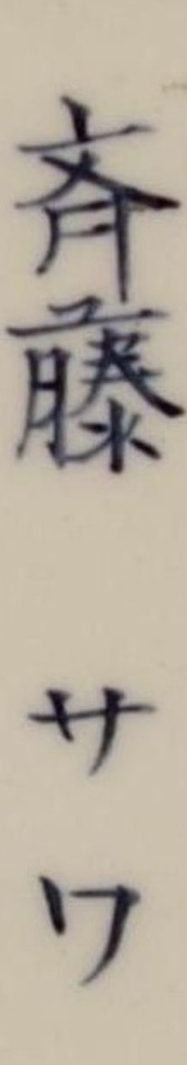斉藤サワ
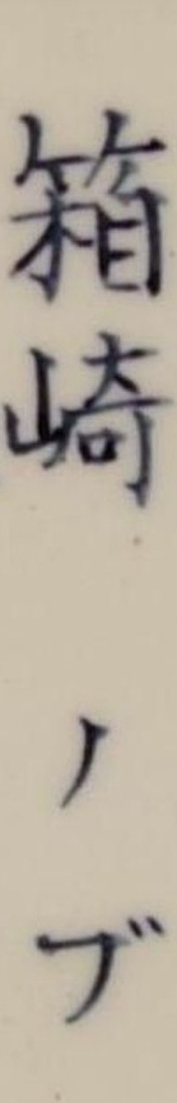箱崎ノブ
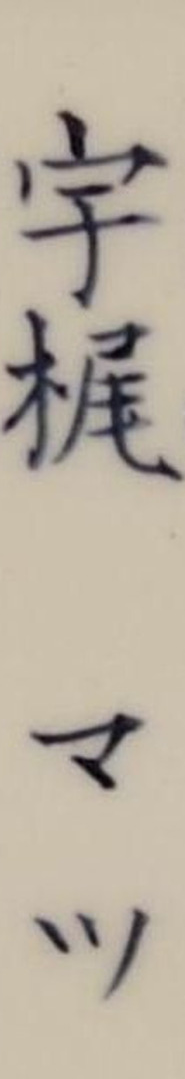宇梶マツ
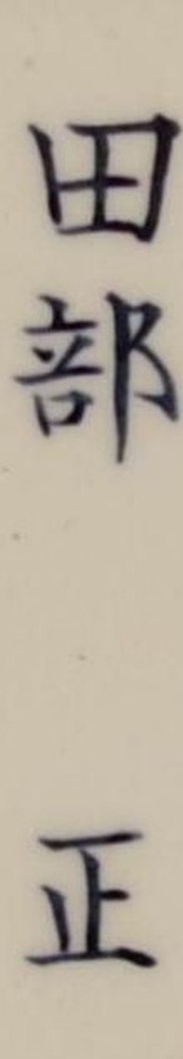田部正
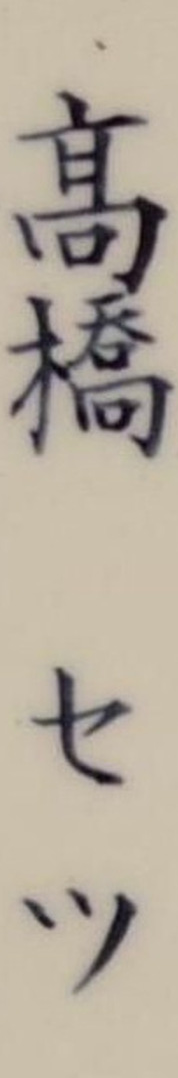高橋セツ
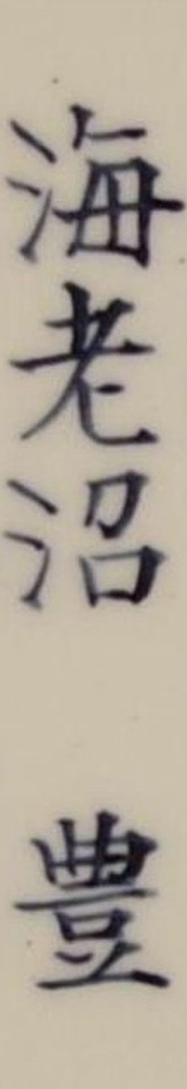海老沼豊
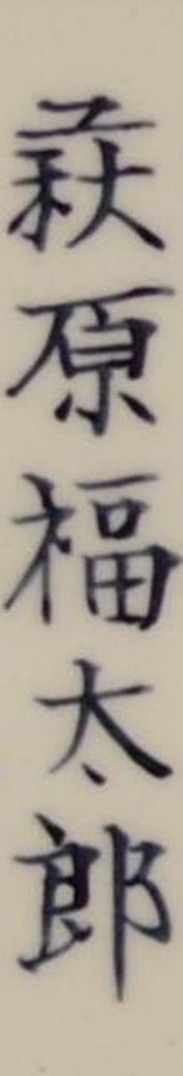萩原福太郎
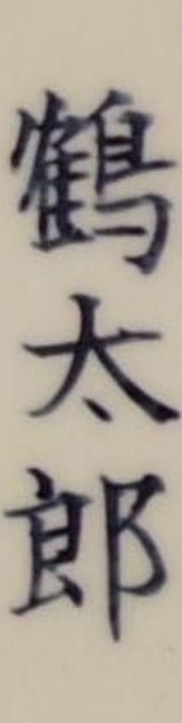鶴太郎
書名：E~L
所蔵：高野山金剛峯寺
